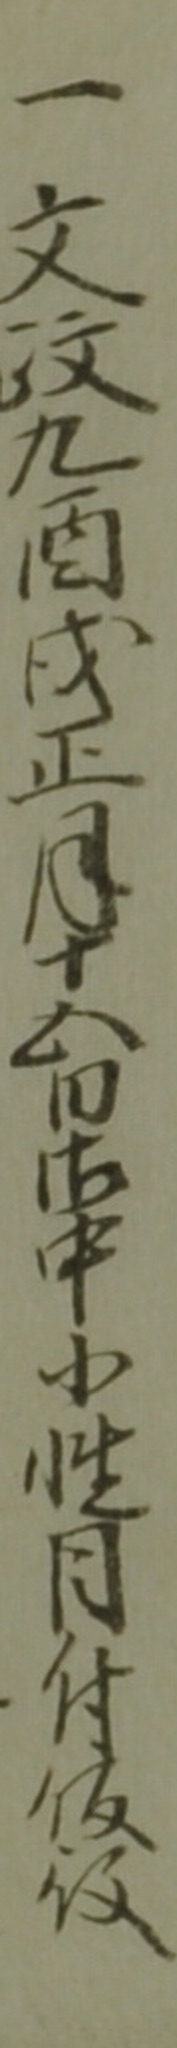一文政九酉戌正月十五日御中小性目付仮役
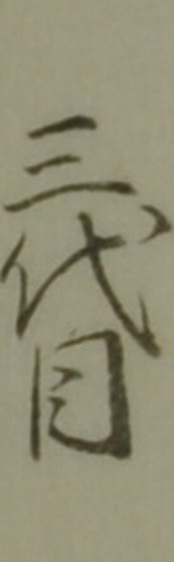三代目
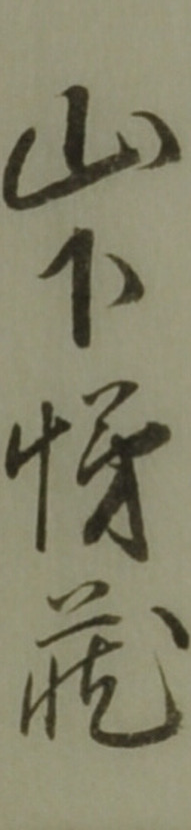山下悌蔵
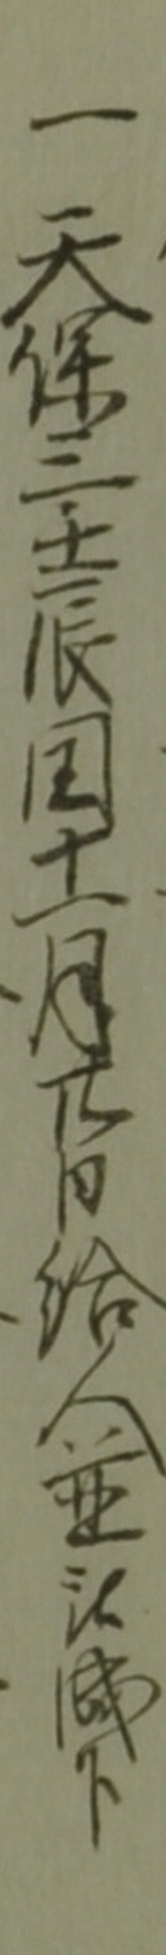一天保三壬辰閏十一月九日給人並被成下
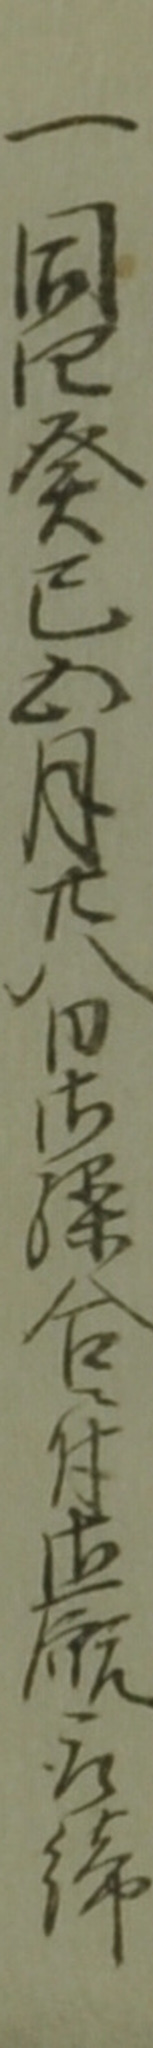一同四癸巳五月廿八日御繰合に付御厩取締
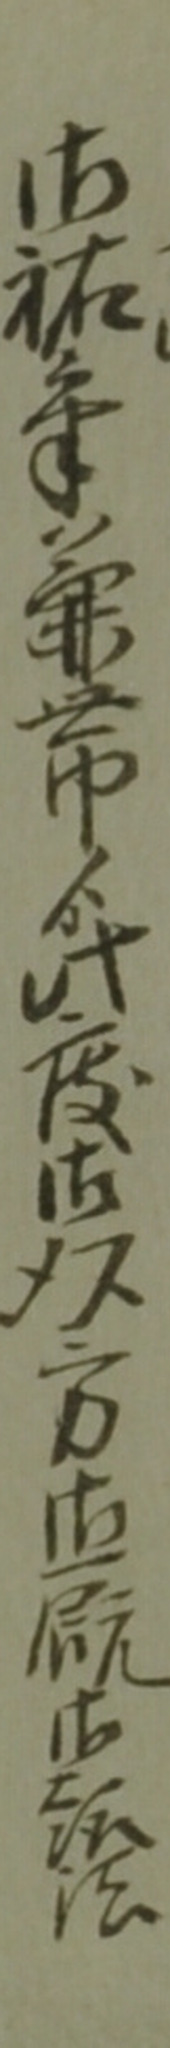御祐筆兼帯より此度御双方御厩御趣法
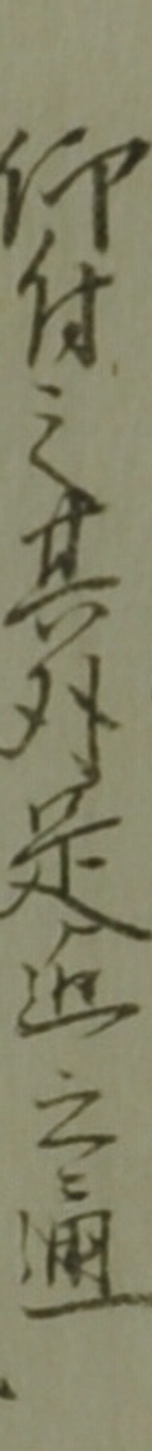仰付之其外是迄之通
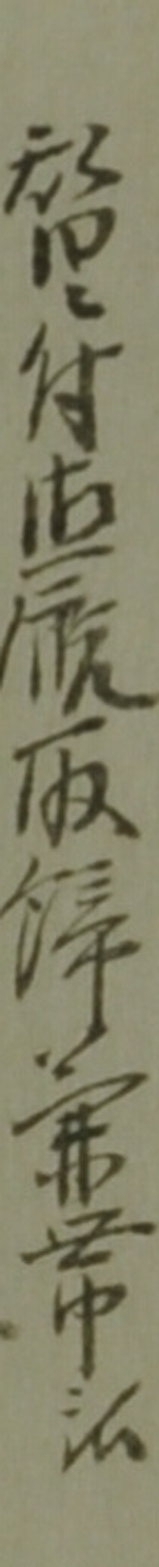替に付御厩取締兼帯
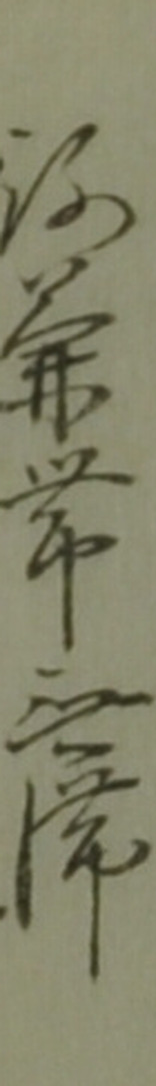役兼帯無滞
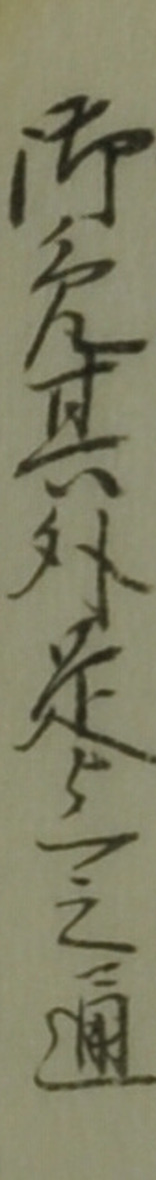御免其外是迄之通
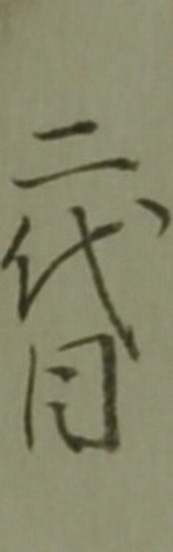二代目
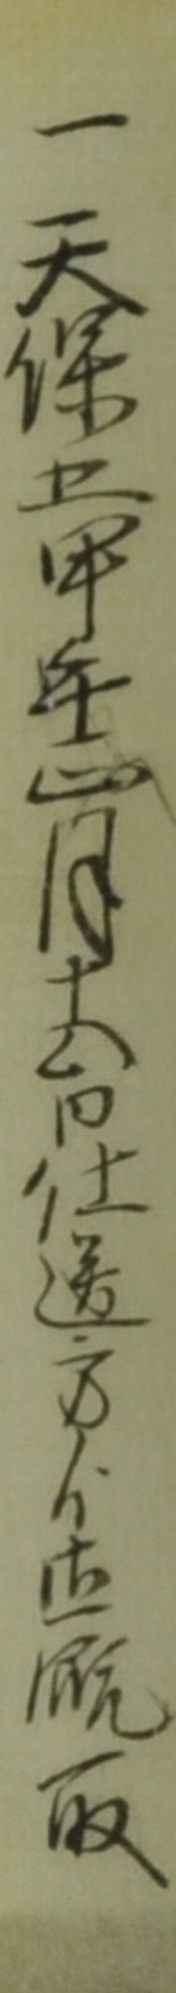一天保五年甲午正月十五日仕送方より御厩取
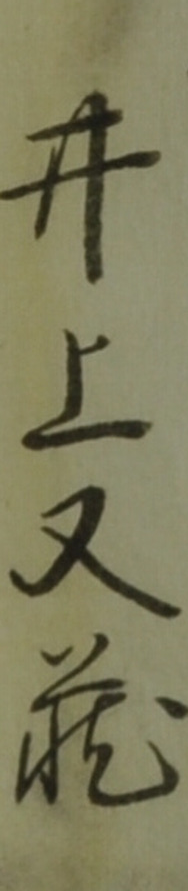井上又蔵

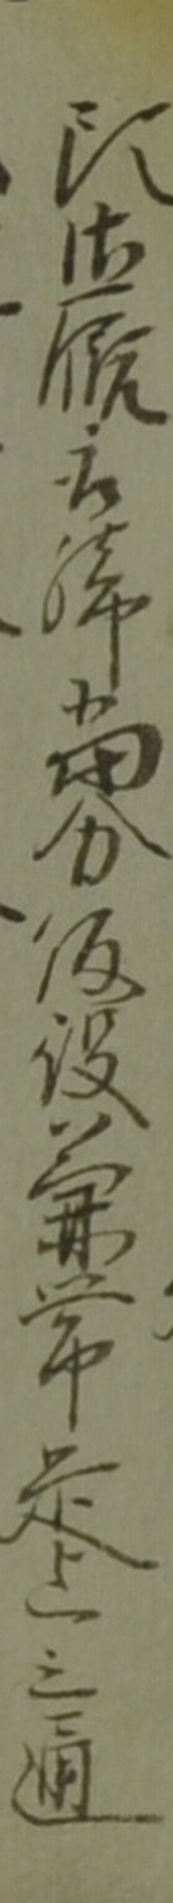頭御厩取締当分仮役兼帯是迄之通
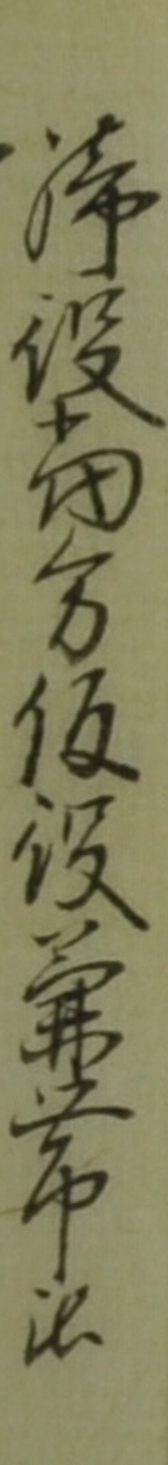締役当分仮役兼帯被
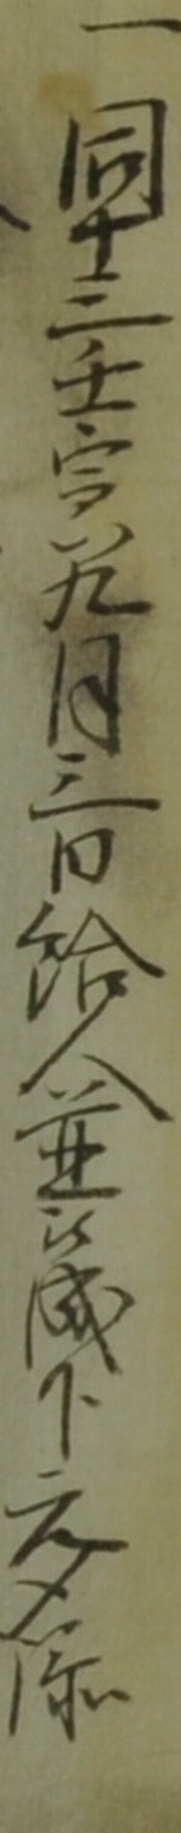一同十三寅九月三日給人並被成下元〆添
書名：諸御役代々録（八）
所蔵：伊那市立高遠町図書館・合同会社AMANE
